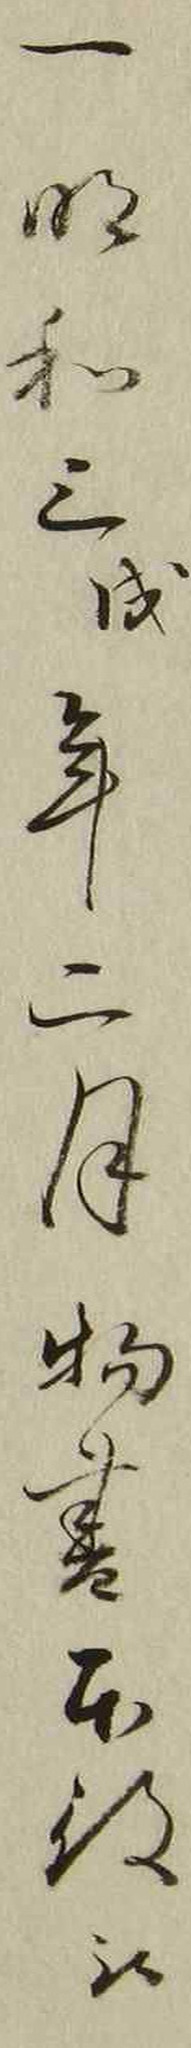一明和三戌年二月物書本役被
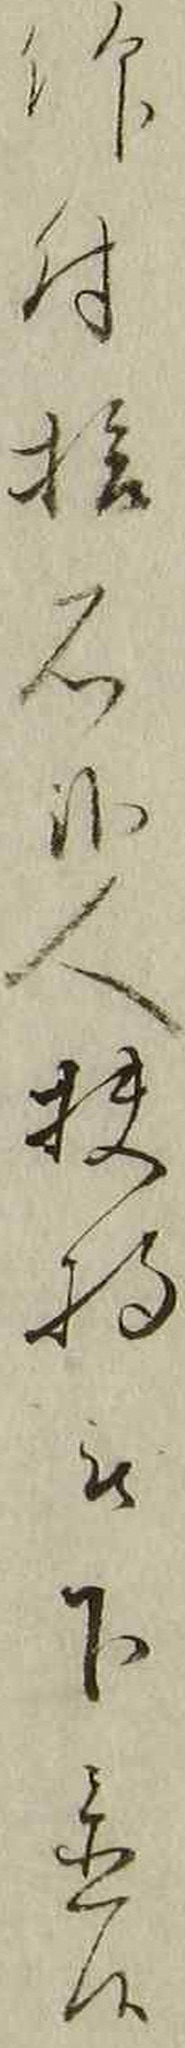仰付拾石弐人扶持被下置候
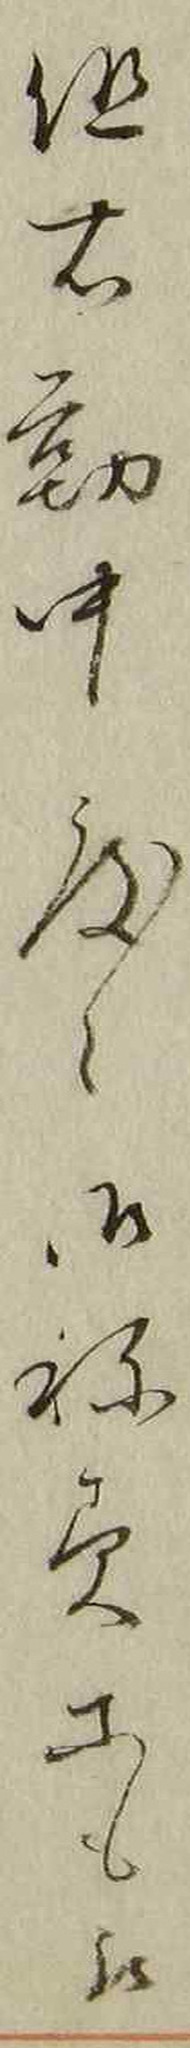但右勤中度々御称美等も被
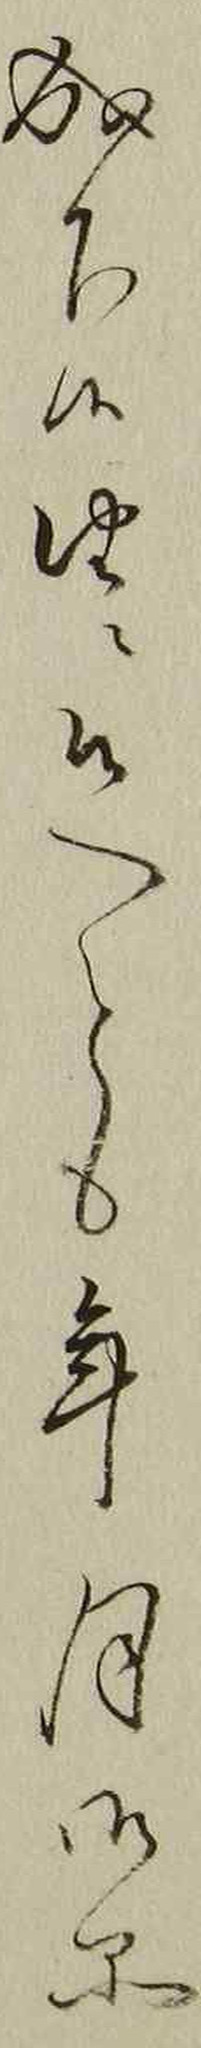成下候由ニ候へとも年月御品
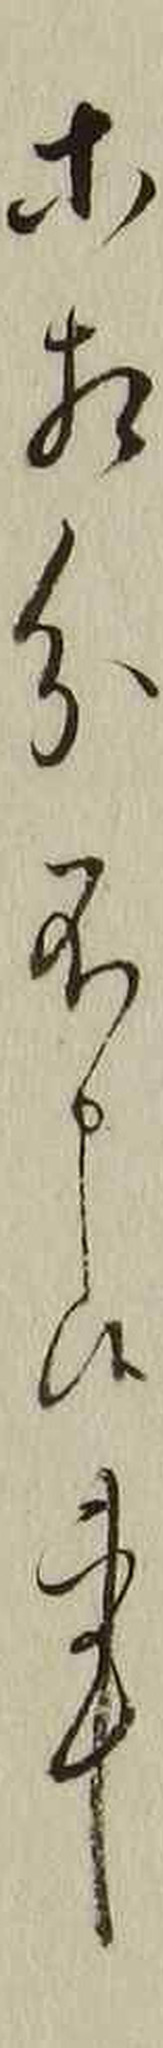等相分不申候事
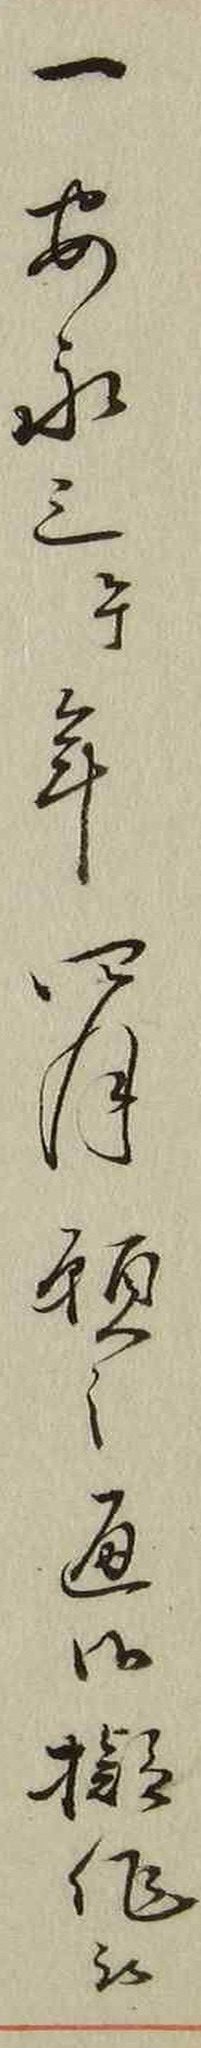一安永三午年四月願之通御擬作被
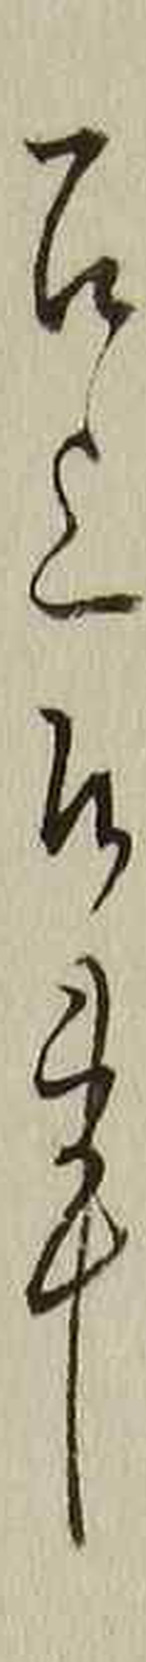召上候事
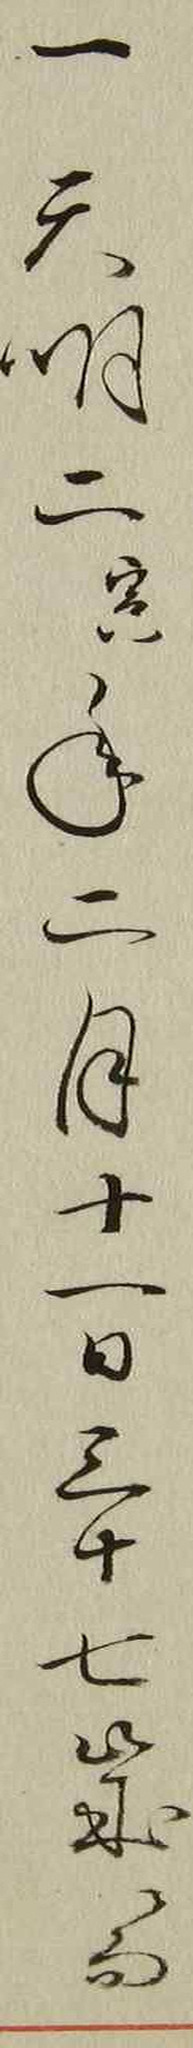一天明二寅年二月十一日三十七歳ニ而
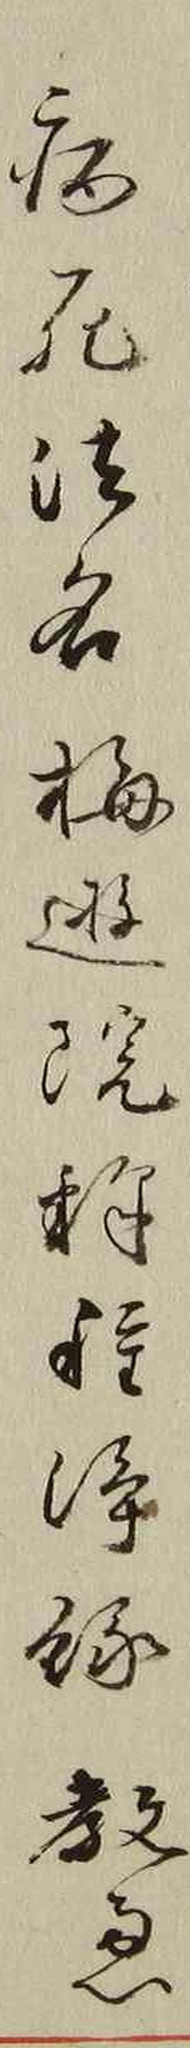病死法名梅遊院釈種浄縁教恵
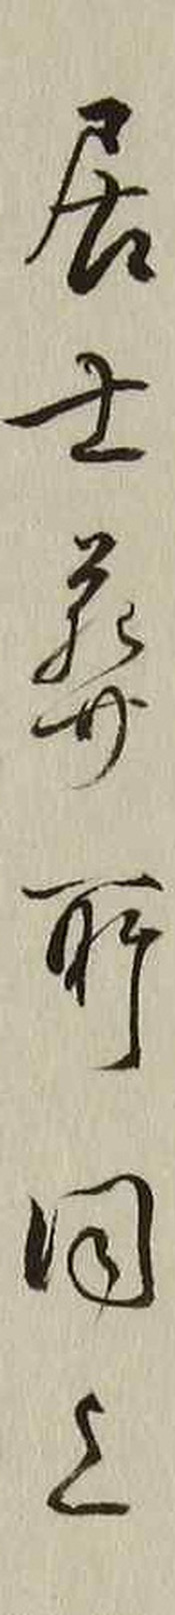居士葬所同上
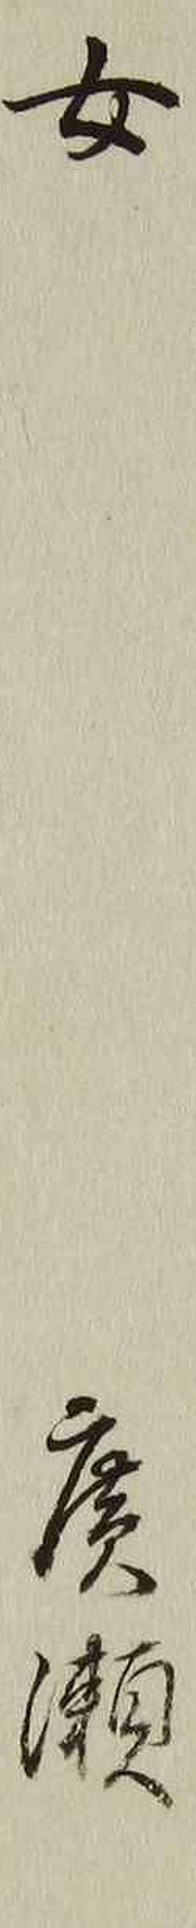女広瀬
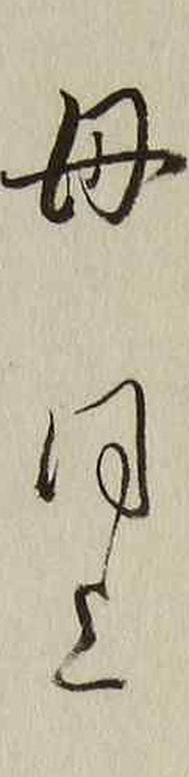母同上
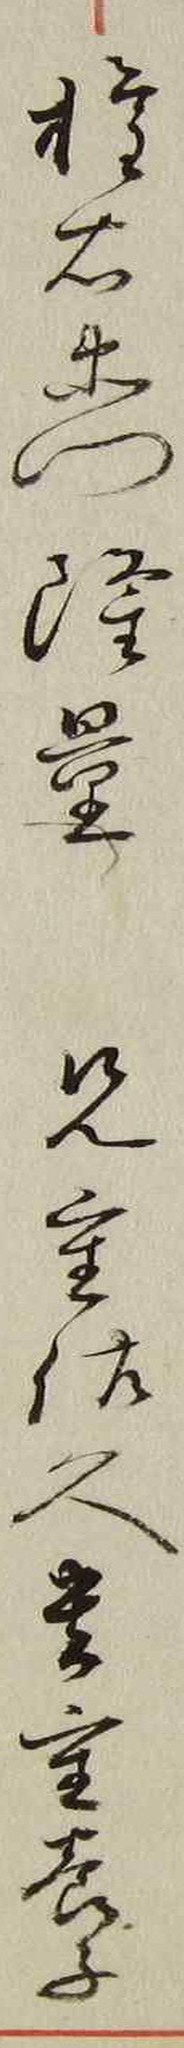権右衛門隆量兄重佐久貴重養子
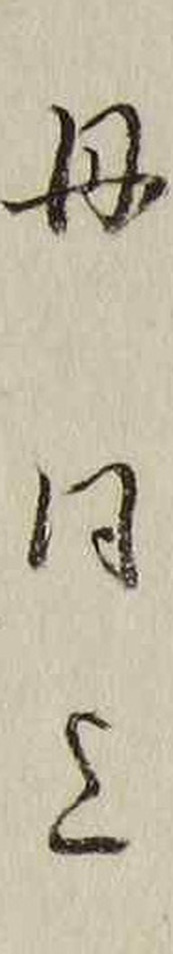母同上

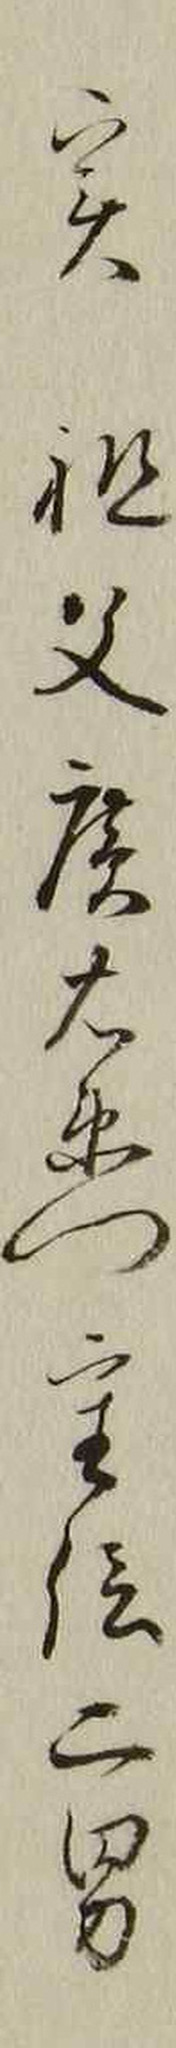実祖父広右衛門重信二男
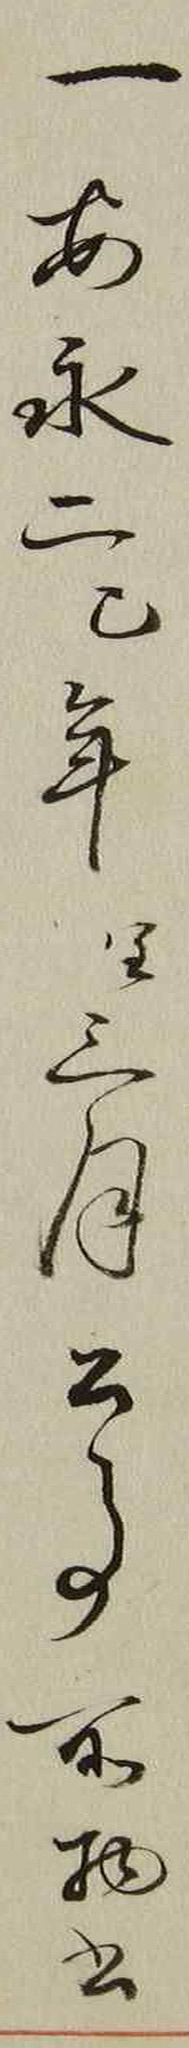一安永二巳年閏三月公事所物書
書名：諸士系譜　巻之8　い之部8
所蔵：会津若松市立会津図書館
